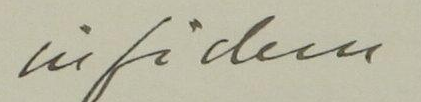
in fidem
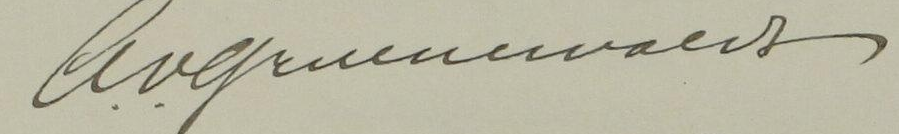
A.v.Gruenewaldt
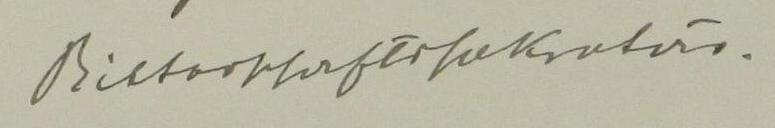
Ritterschaftssekretär
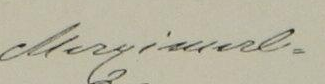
Maximal-
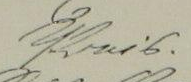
Preis
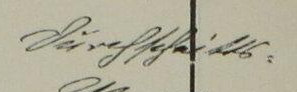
Durchschnitts-
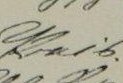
Preis
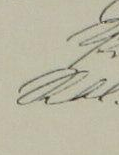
Rbl.
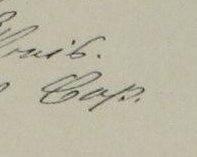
Cop.
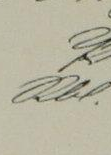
Rbl.
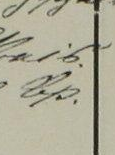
Cop.
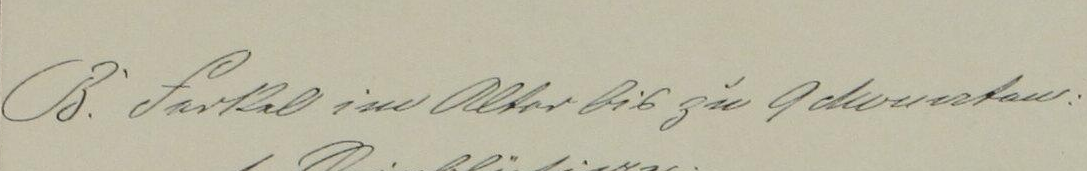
B. Ferkel im Alter bis zu 9 Monaten:
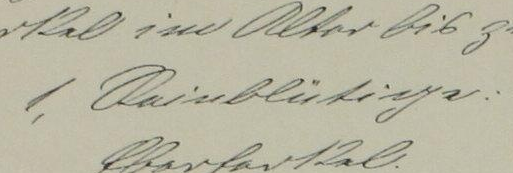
1. Reinblütige:
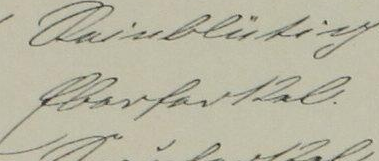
Eberferkel
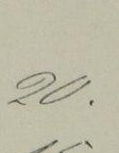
20
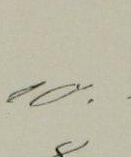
10
